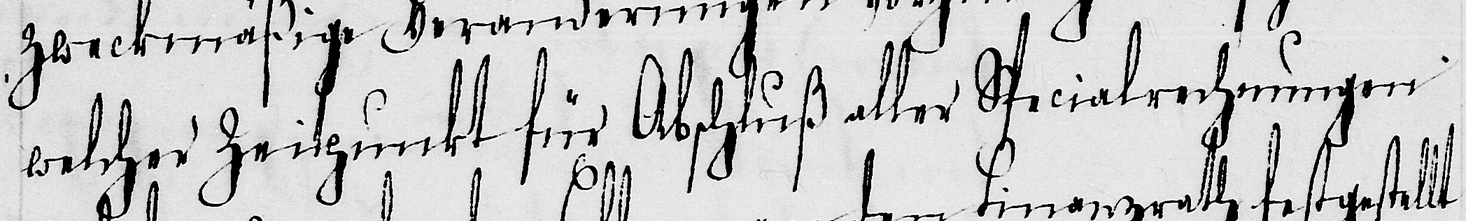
welcher Zeitpunkt für Abschluß aller Specialrechnungen
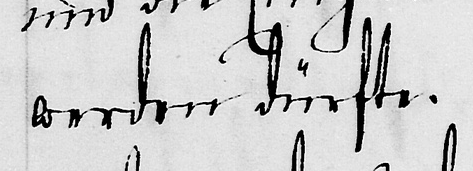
werden dürfte.
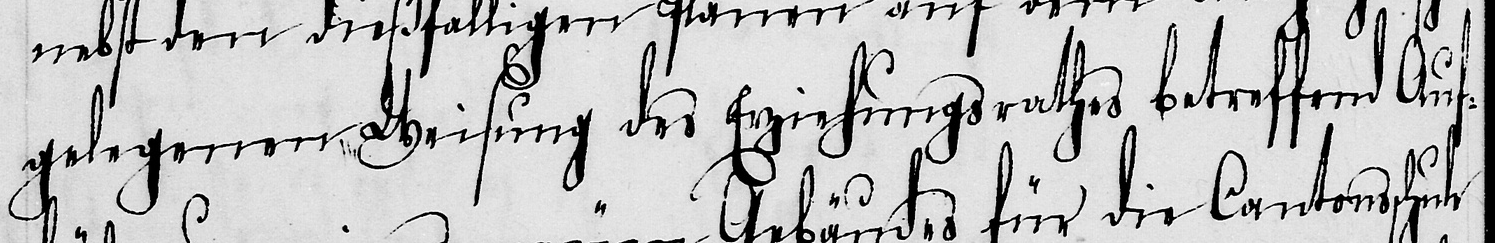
gelegenen Weisung des Erziehungsrathes betreffend Auf¬
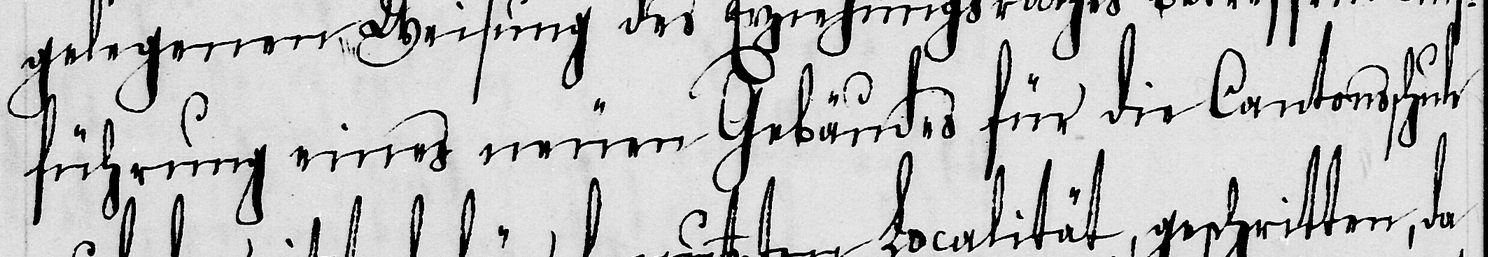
führung eines neuen Gebäudes für die Cantonsschule
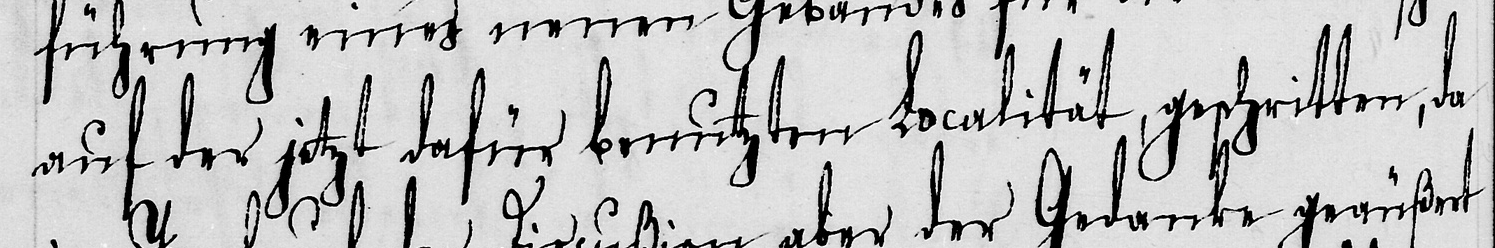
auf der jetzt dafür benutzen Localität, geschritten,
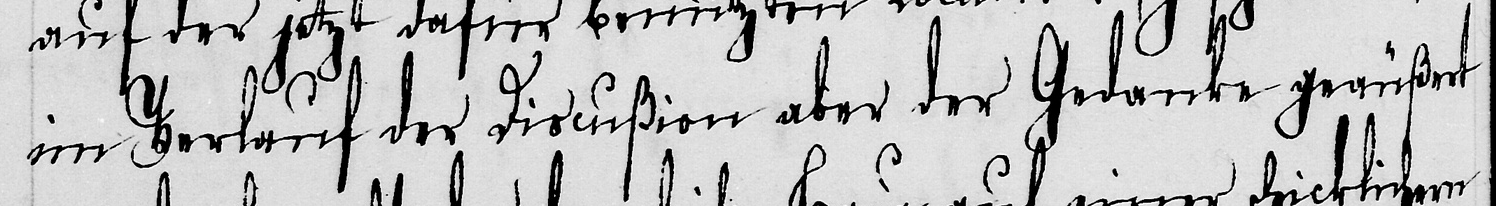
im Verlauf der Discußion aber der Gedanke geäußert
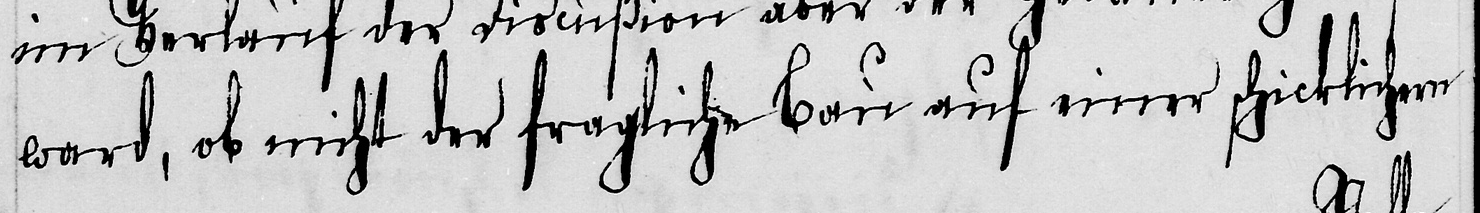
ward, ob nicht der fragliche Bau auf einer schicklichern
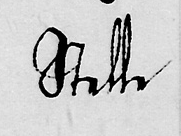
stellt
